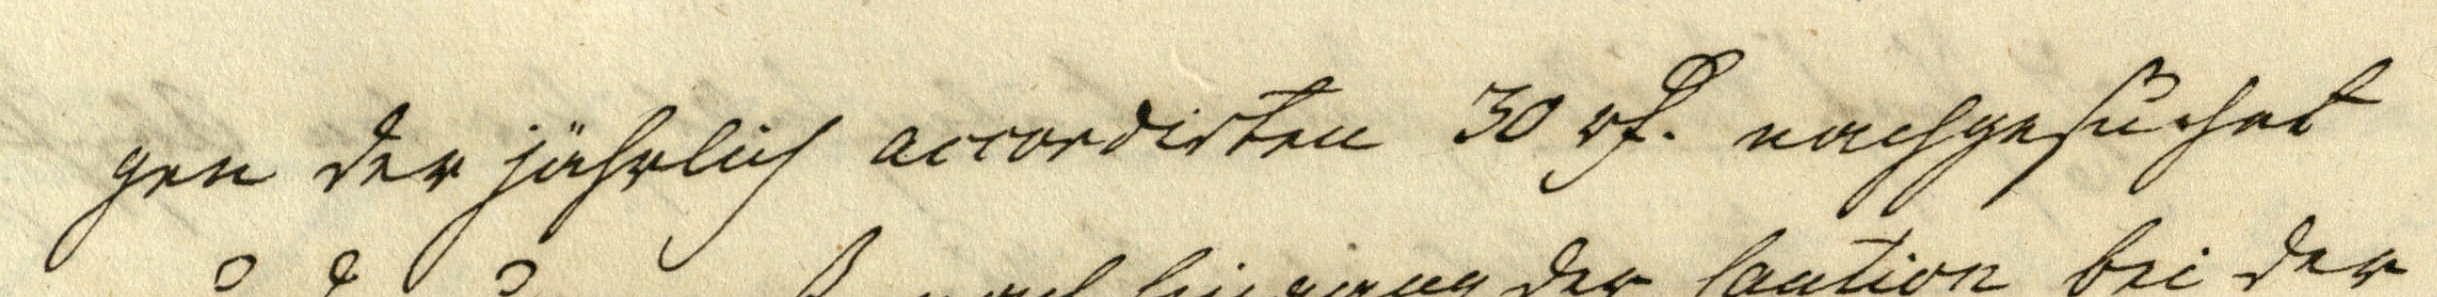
gen der jährlich accordirten 30 rtl. nachgesuchet
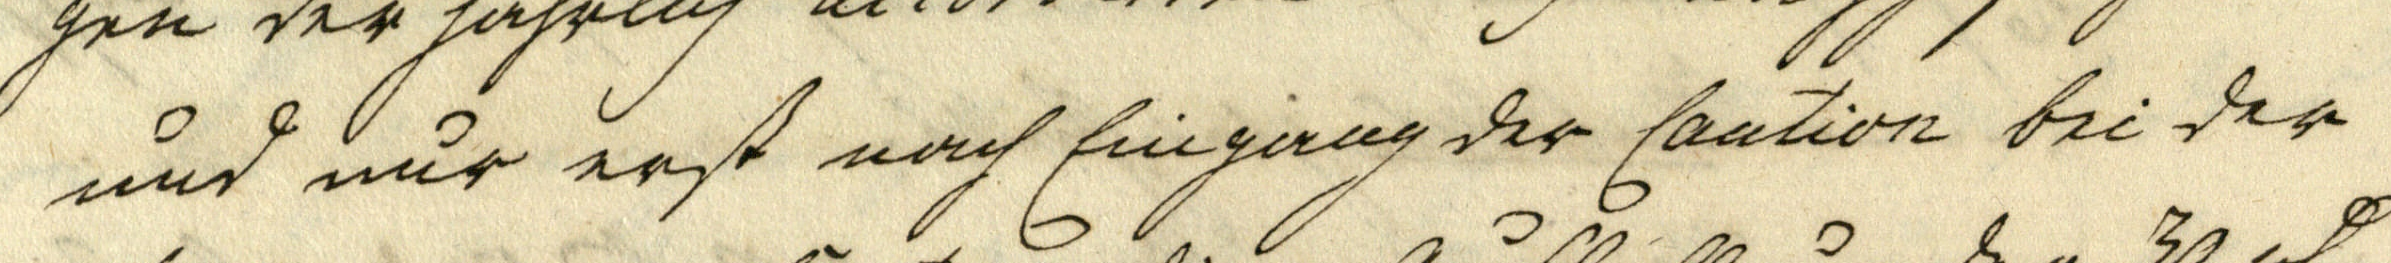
und nur erst nach Eingang der Caution bei der
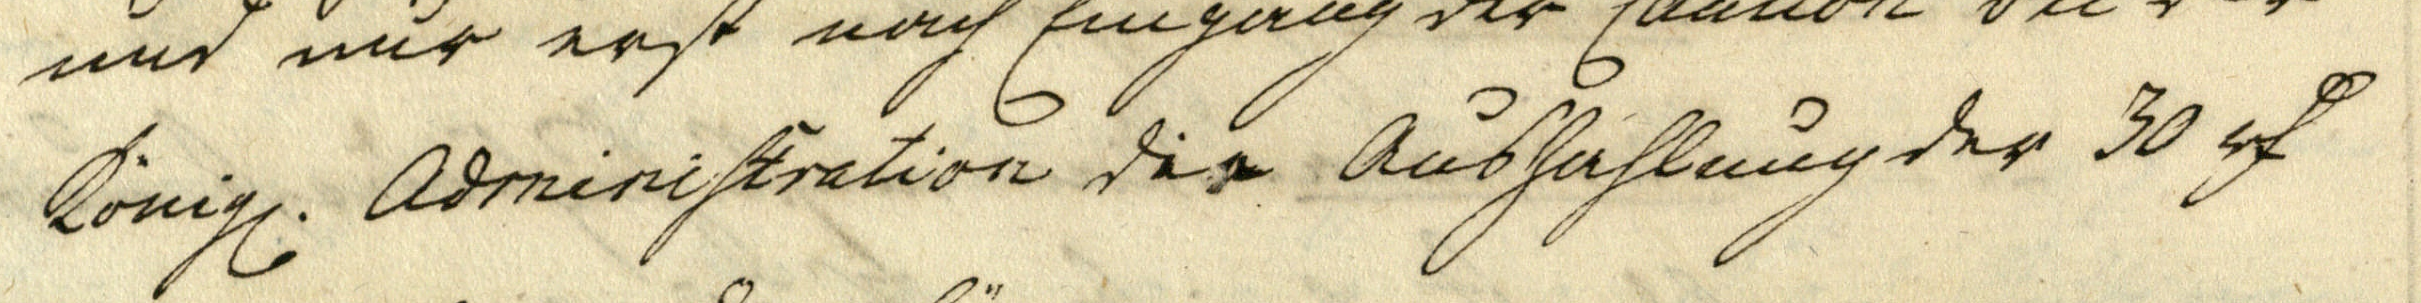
Königl. Administration die Auszahlung der 30 rtl.
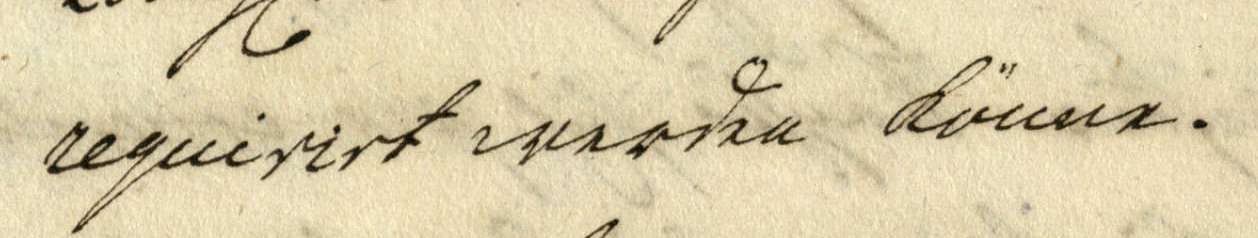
requrirt werden könne.
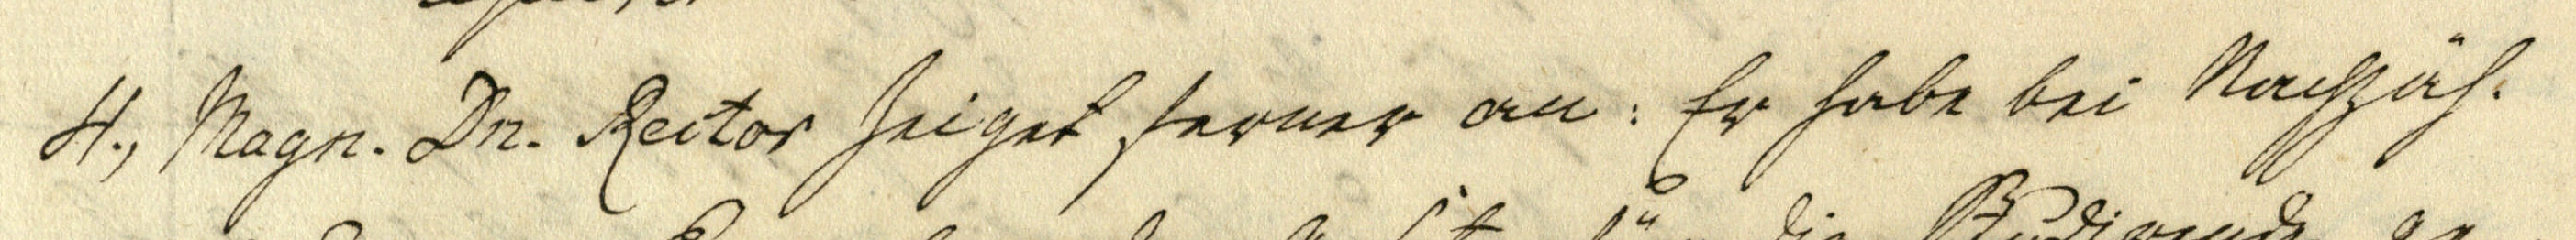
4., Magn. Dn. Rector zeiget ferner an: Er habe bei Nachzäh-
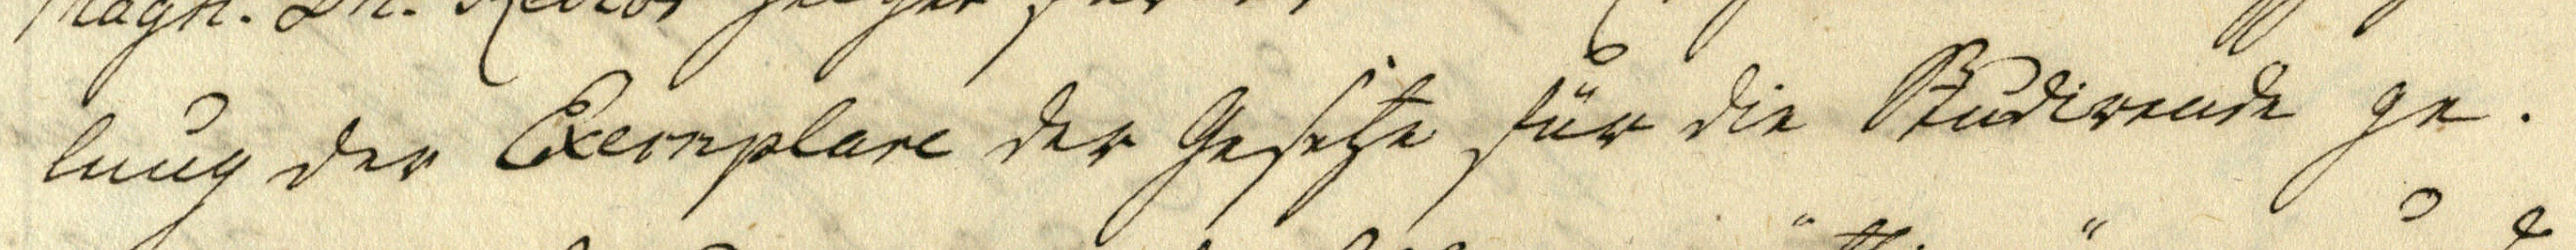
lung der Exemplare der Gesetze für die Studirende ge-
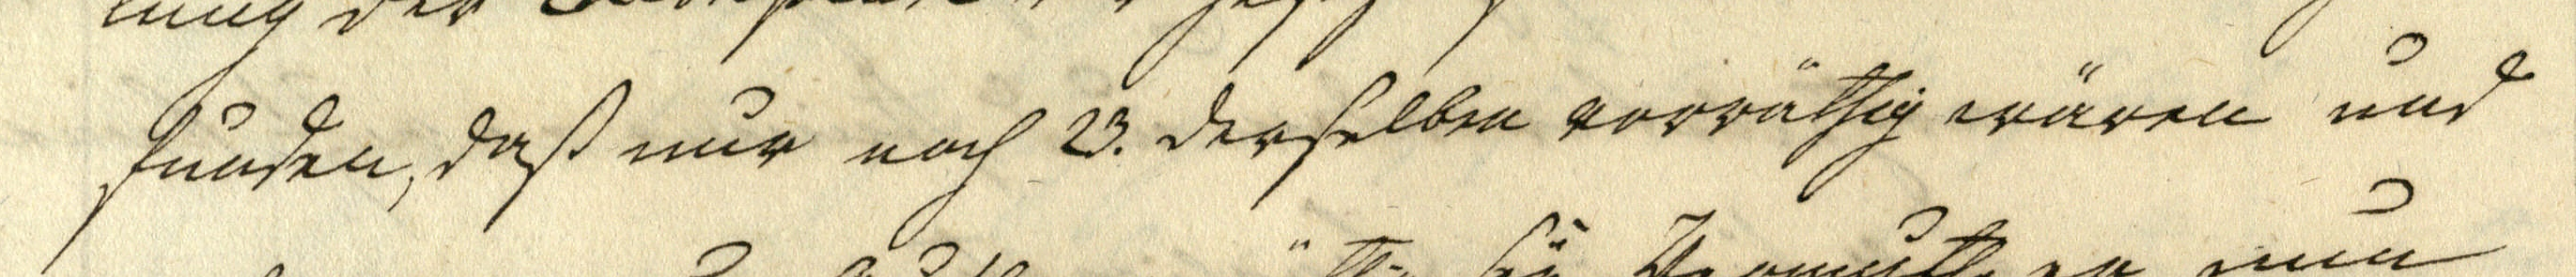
funden, daß nur noch 23 derselben vorräthig wären und
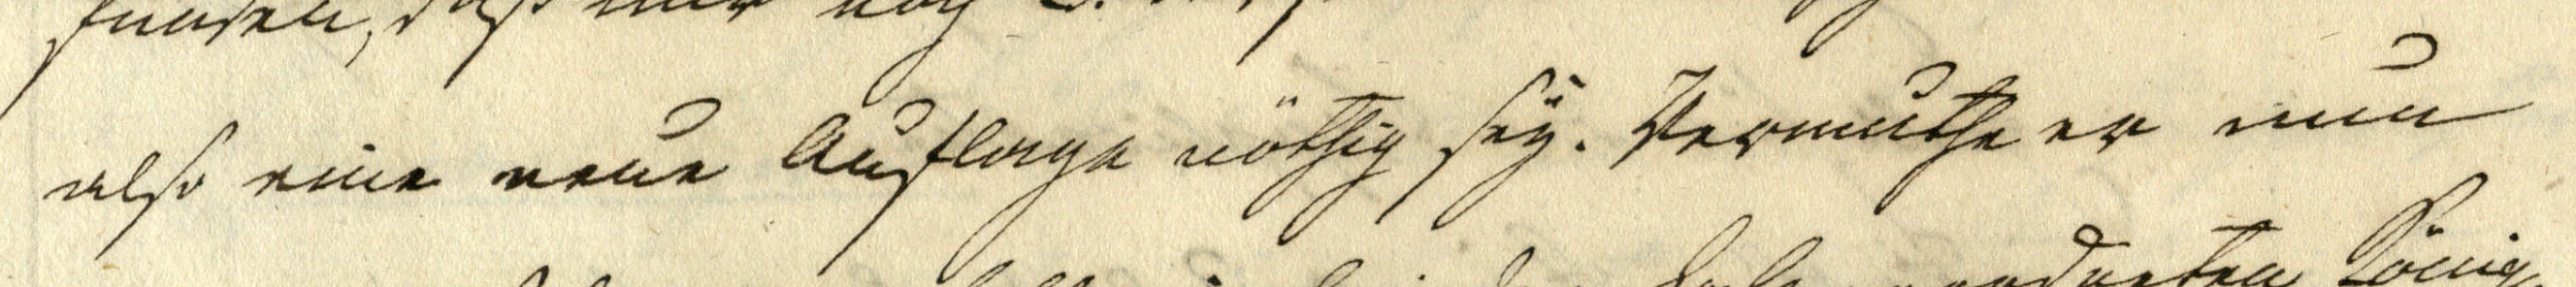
also eine neue Auflage nöthig sey. Vermuthe er nun
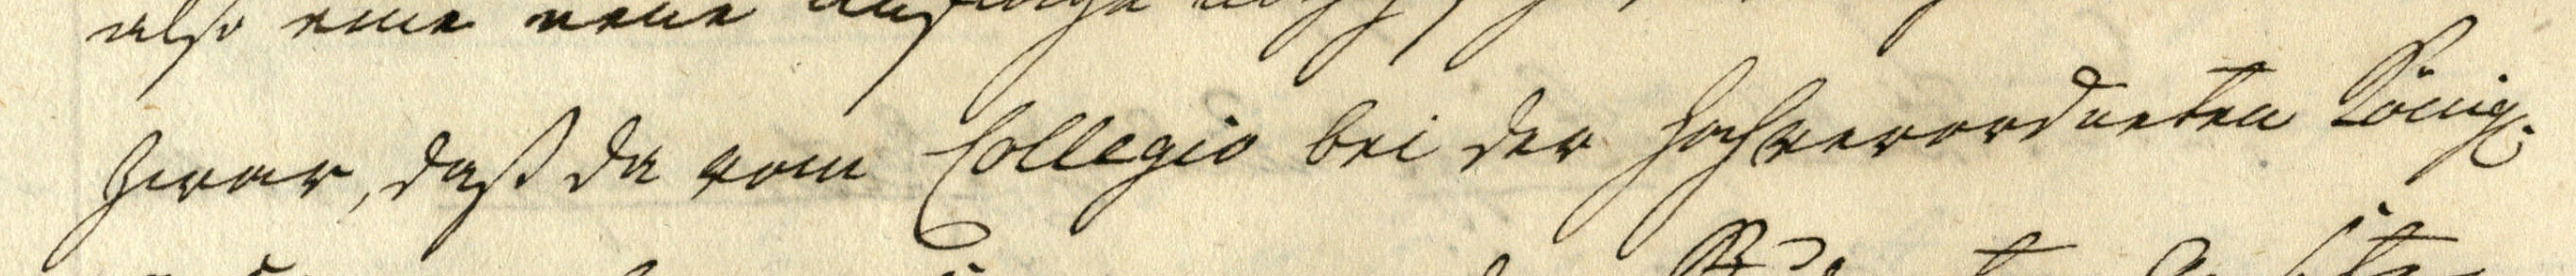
zwar, daß da vom Collegio bei der hochverordneten Königl.
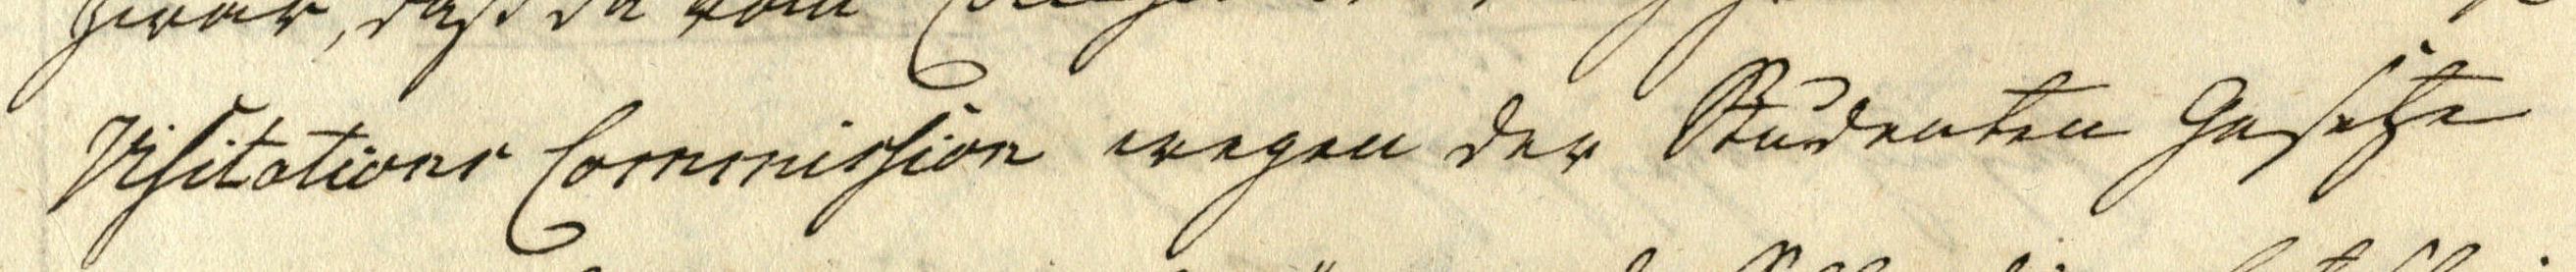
Visitations Commission wegen der Studenten Gesetze
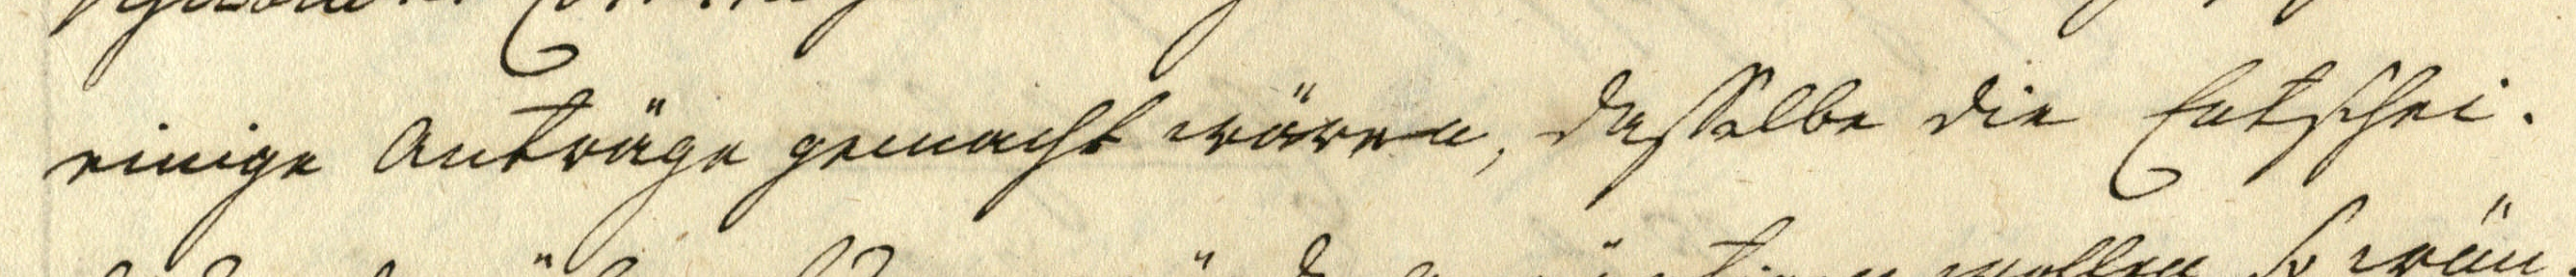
einige Anträge gemacht wären, deshalbe die Entschei-
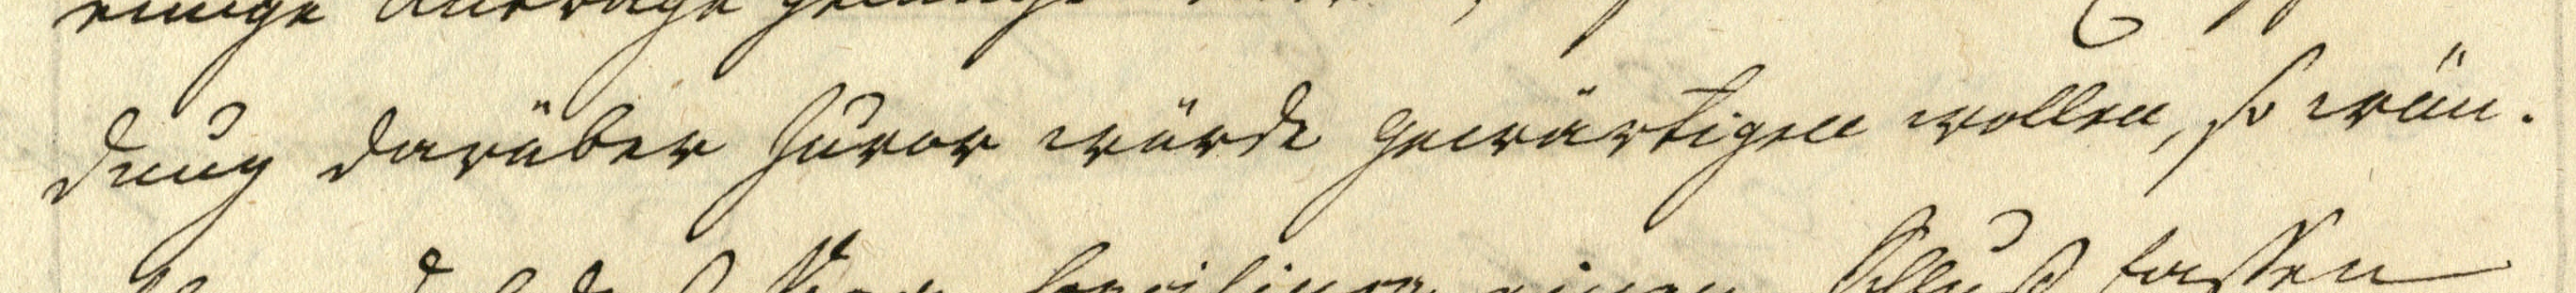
dung darüber zwar würde gewärtigen wollen, so wün-
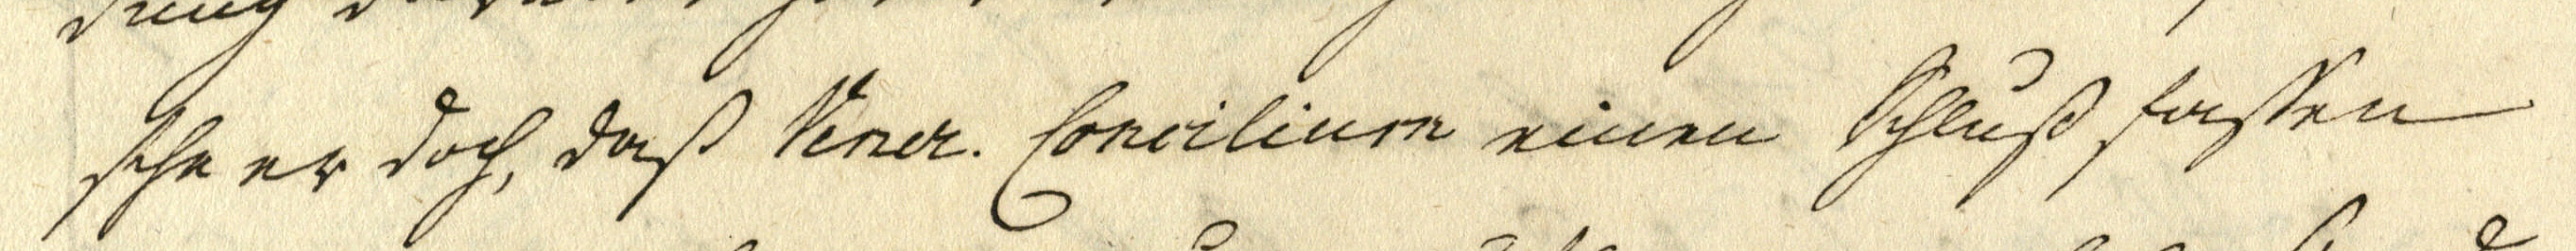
sche er doch, daß Vener. Concilium einen Schluß fassen
